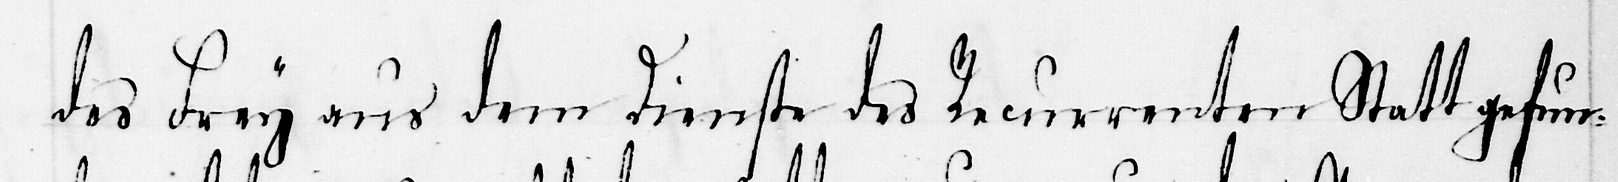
des Frey aus dem Dienste des Recurrenten Statt gefun¬
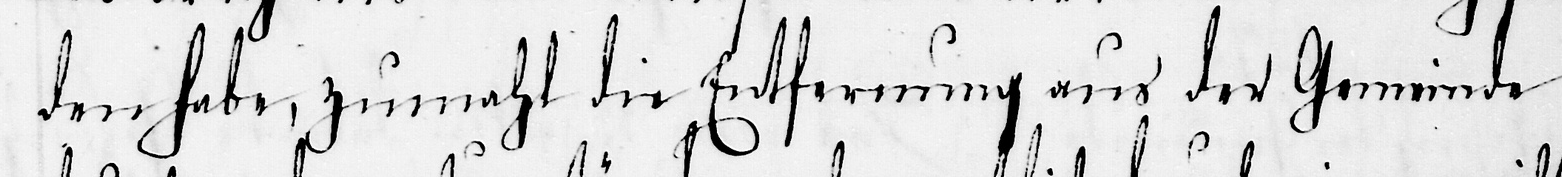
den habe, zumahl die Entfernung aus der Gemeinde
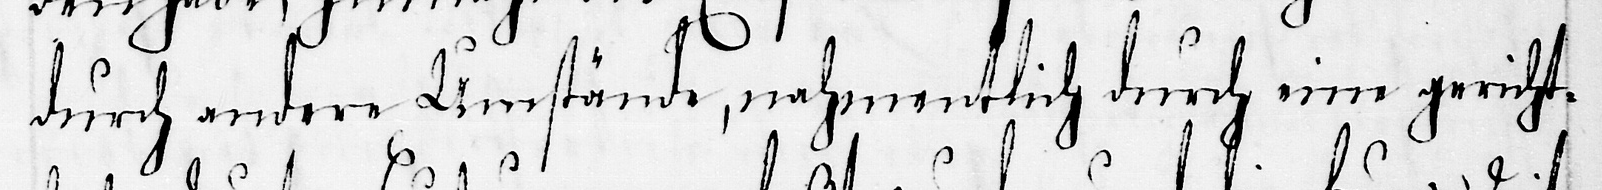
durch andere Umstände, nahmentlich durch eine gericht¬
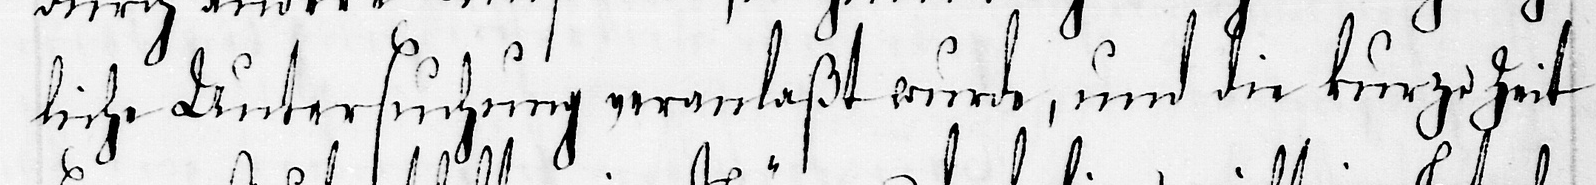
liche Untersuchung veranlaßt wurde, und die kurze Zeit
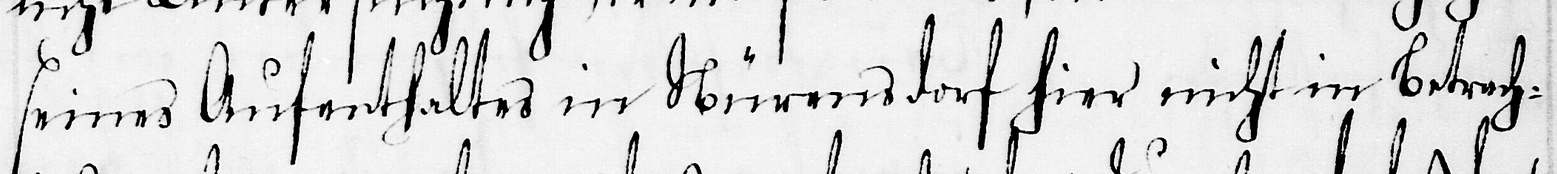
seines Aufenthaltes in Nürensdorf hier nicht in Betrach¬
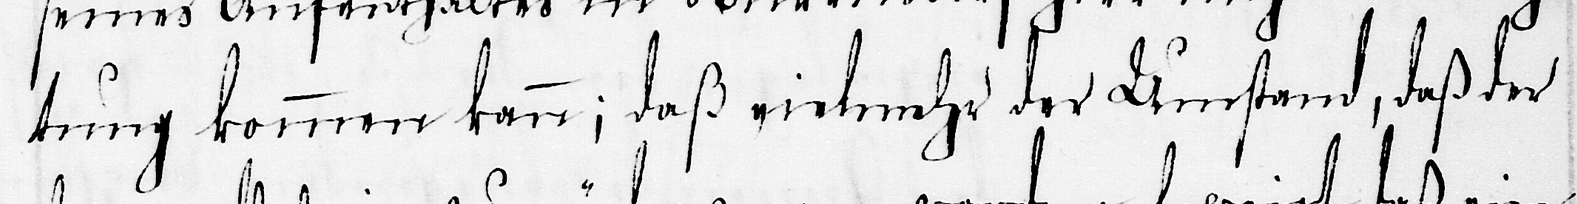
tung kommen kann; daß vielmehr der Umstand, daß der
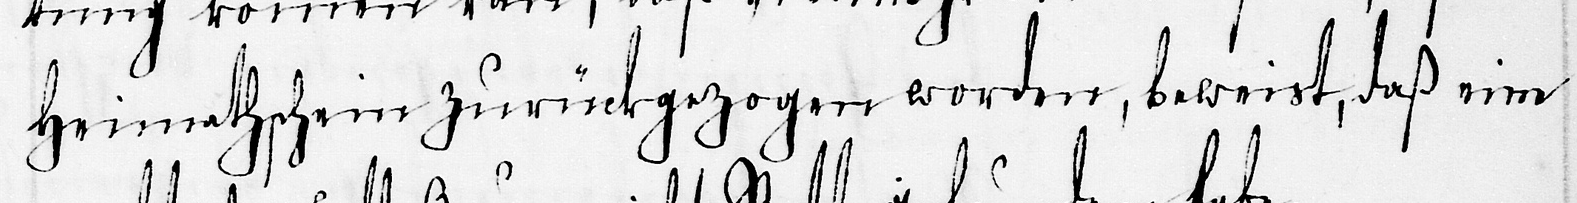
Heimathschein zurückgezogen worden, beweist, daß eine
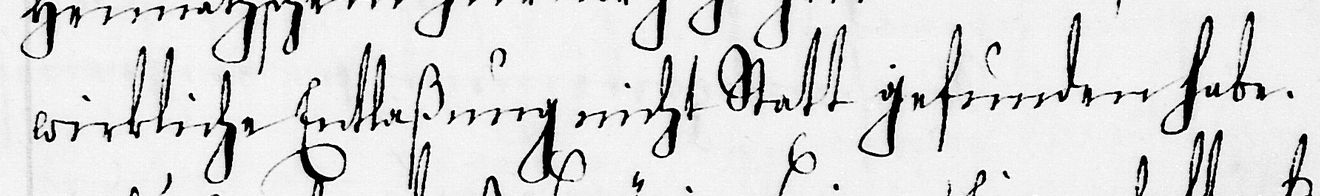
wirkliche Entlaßung nicht Statt gefunden habe.
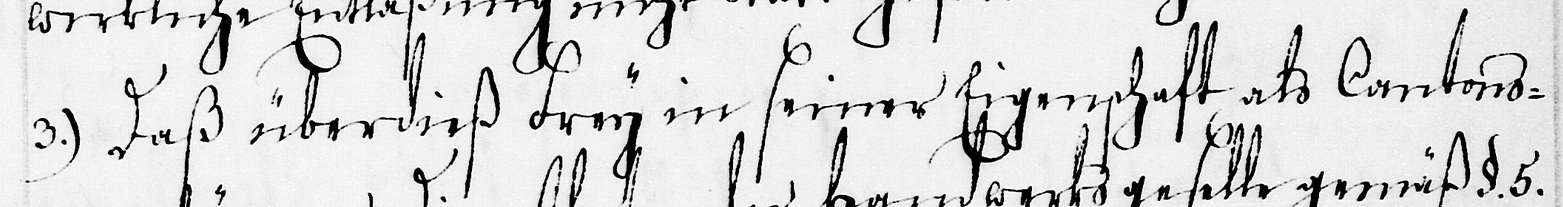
3.) Daß überdieß Frey in seiner Eigenschaft als Cantons¬
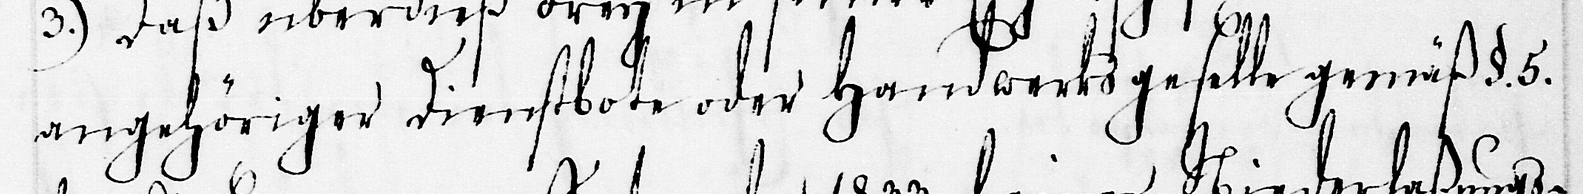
angehöriger Dienstbote oder Handwerksgeselle gemäß §. 5.
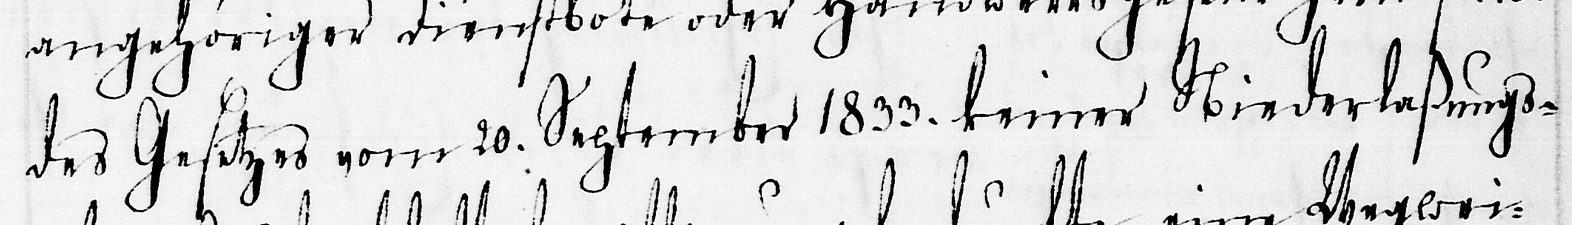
des Gesetzes vom 20. September 1833. keiner Niederlaßungs-
